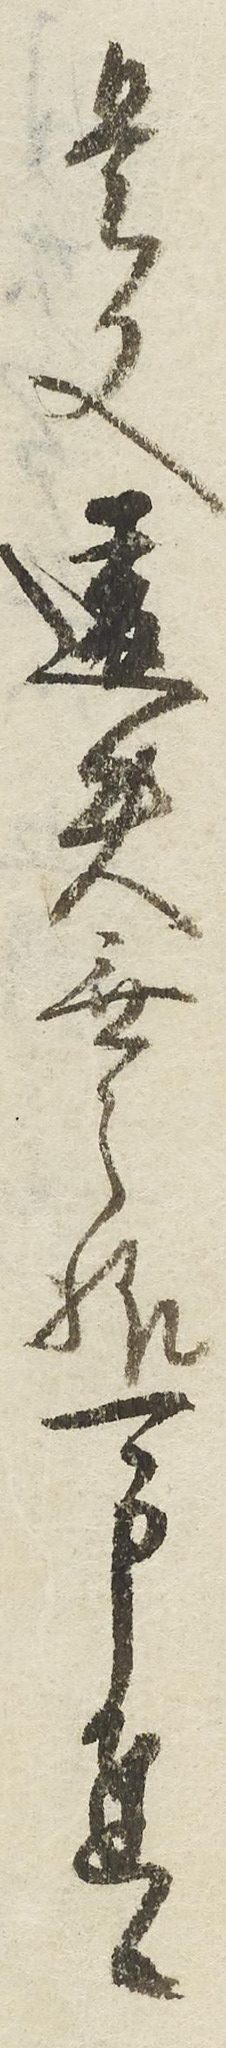是又違失無之様可申達候
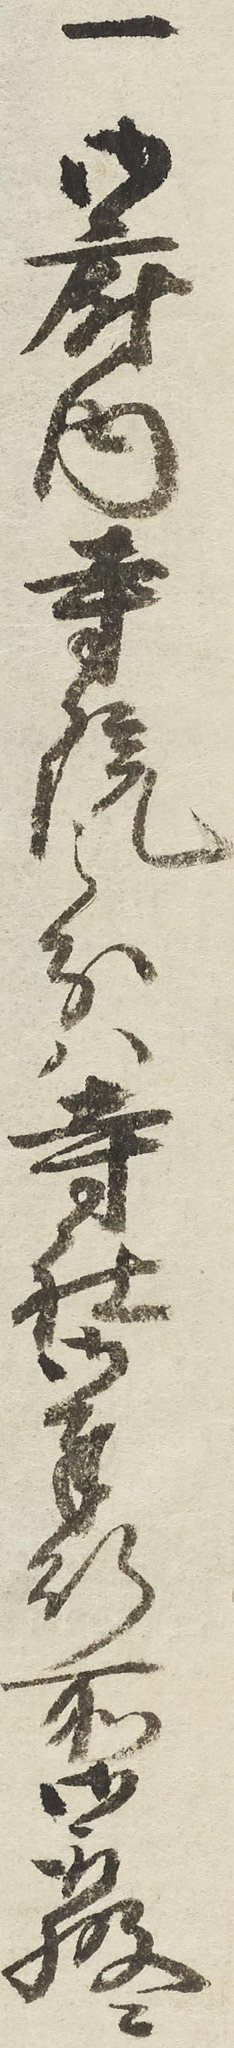一御府内寺院之分ハ寺社御奉行所御取扱二
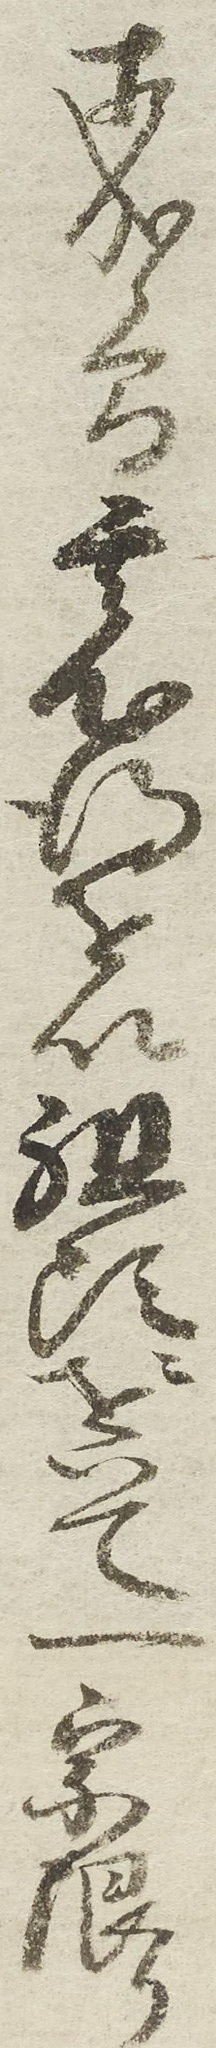相成候間其心得を以組頭二をいて一宗限り
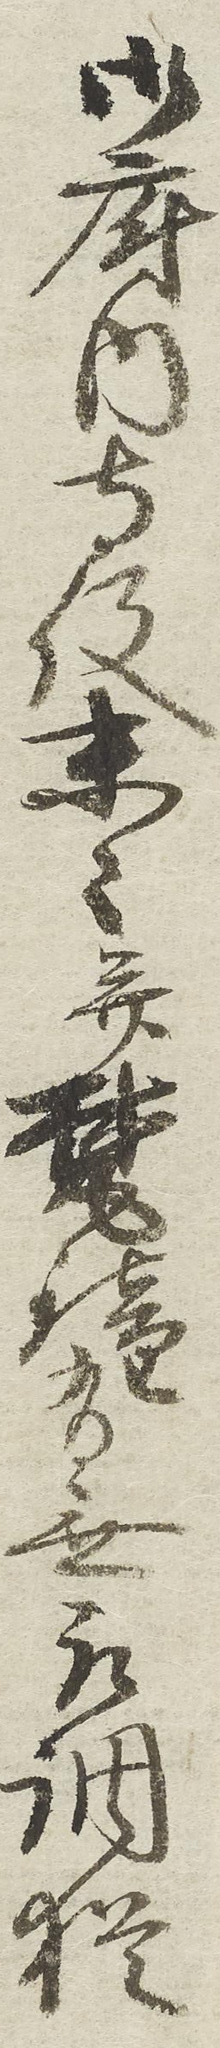御府内寺役未々并梵鐘有無取調猶
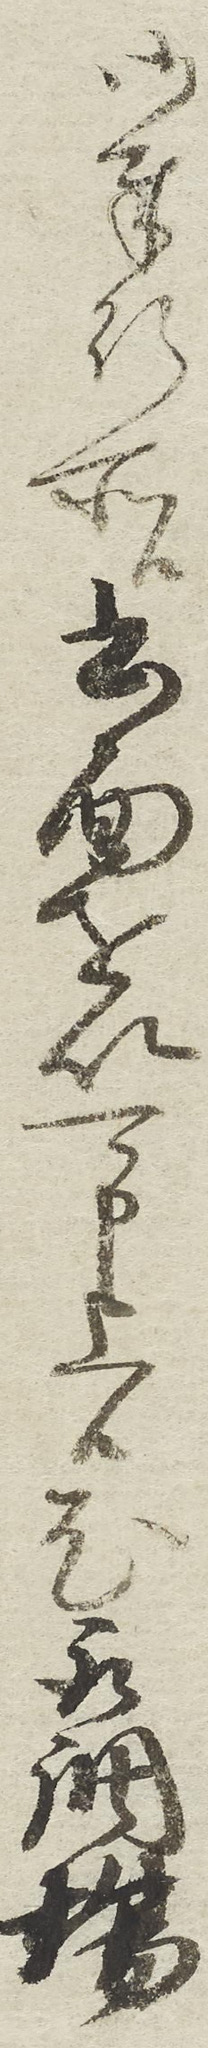御奉行所江書面を以可申上候尤取調場
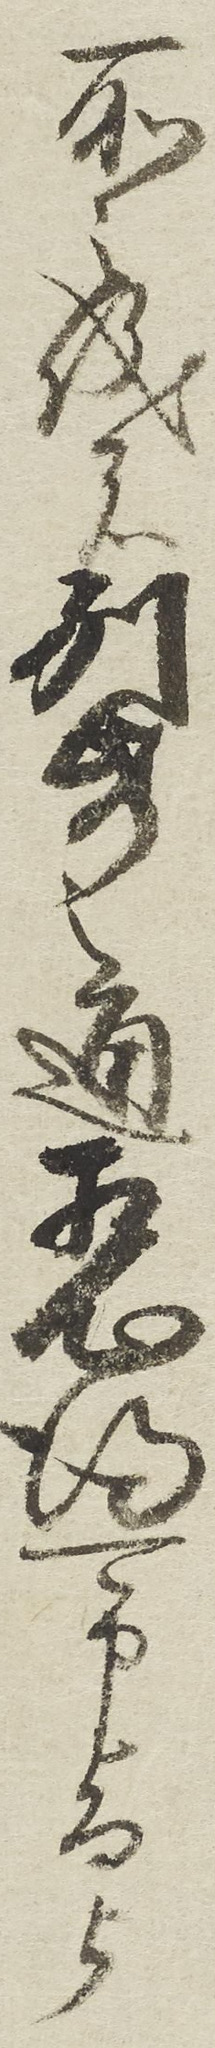所之儀は別紙之通相心得可申旨被
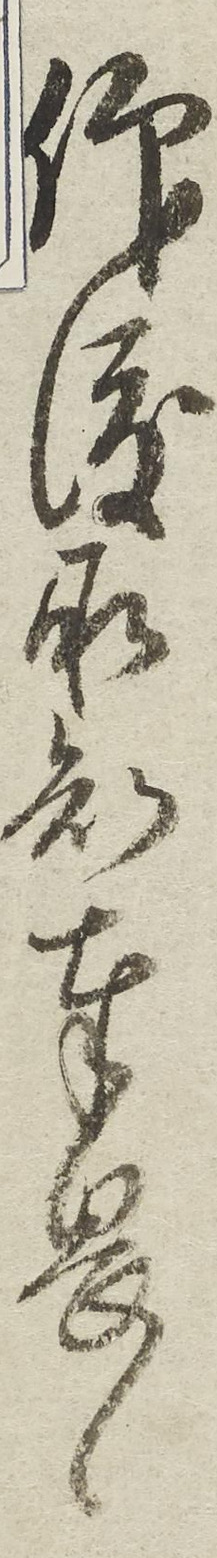仰渡承知奉畏候
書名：[梵鐘差出一件]
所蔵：東京大学地震研究所図書室 Earthquake Research Institute Library, The University of Tokyo, JAPAN
